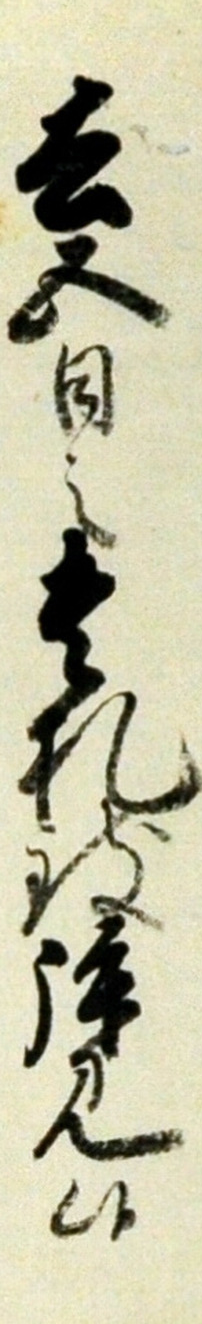去五日之貴札致拝見候
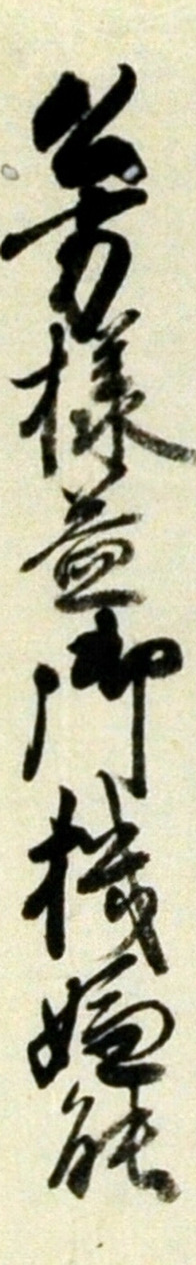公方様益御機嫌能
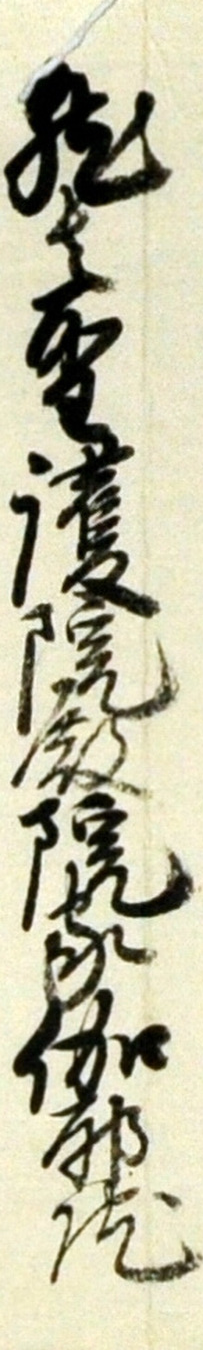然者聖護院殿院家伽耶院
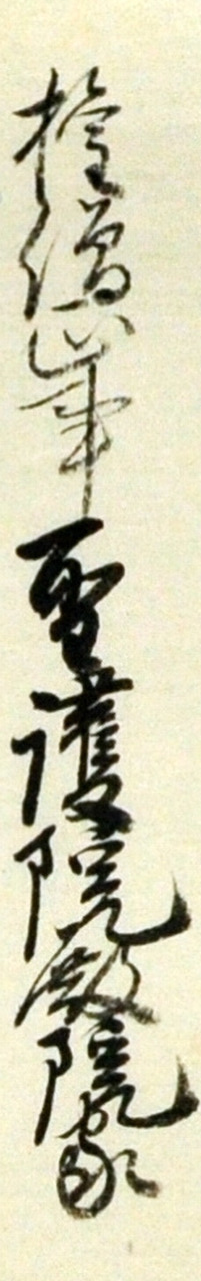権僧正事聖護院殿院家
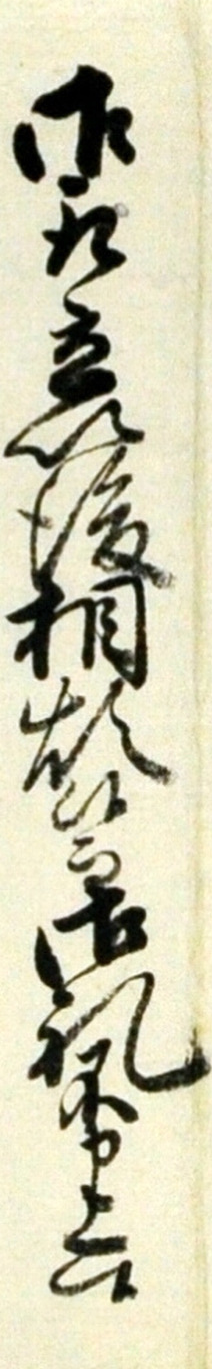御取立以後相煩候而御礼不申上候
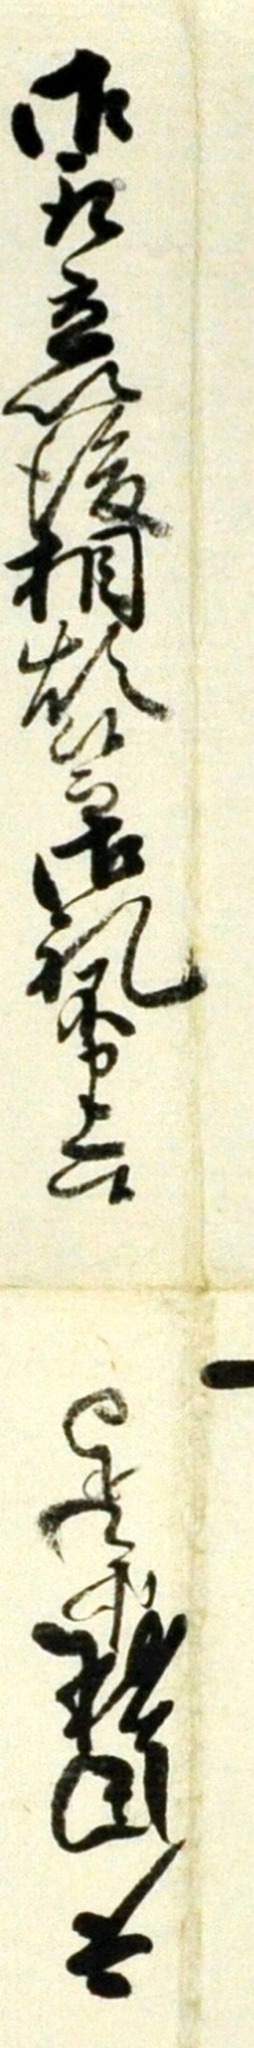御取立以後相煩候而御礼不申上候
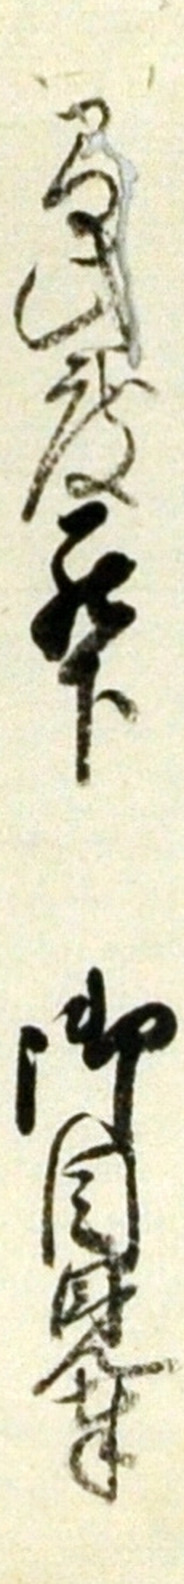間此度罷下御目見奉
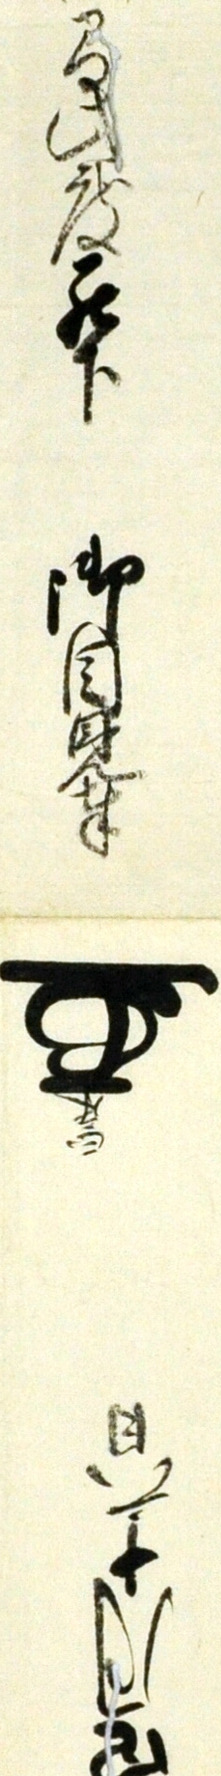間此度罷下御目見奉
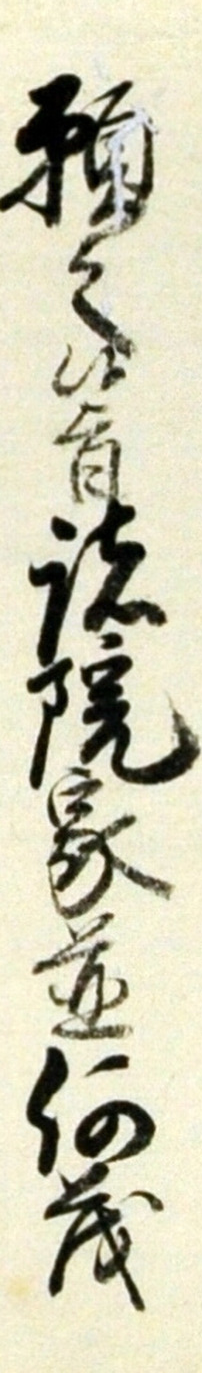願之候旨諸院家並何茂
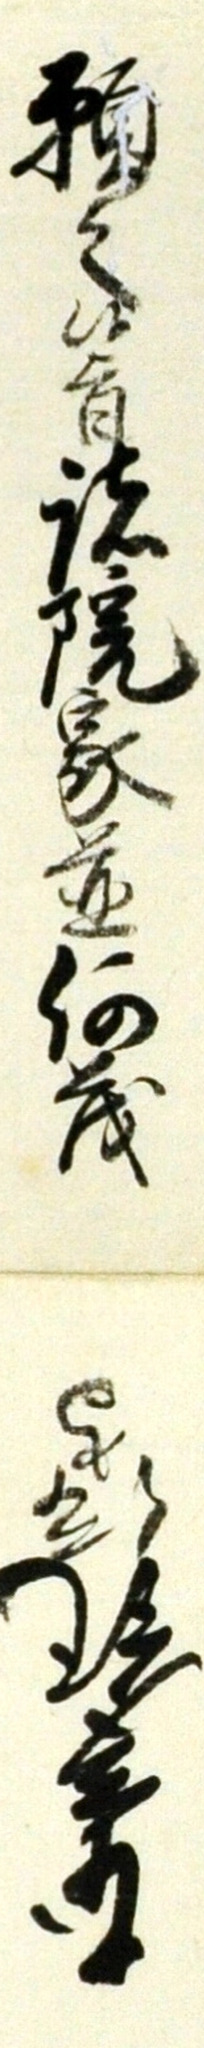願之候旨諸院家並何茂
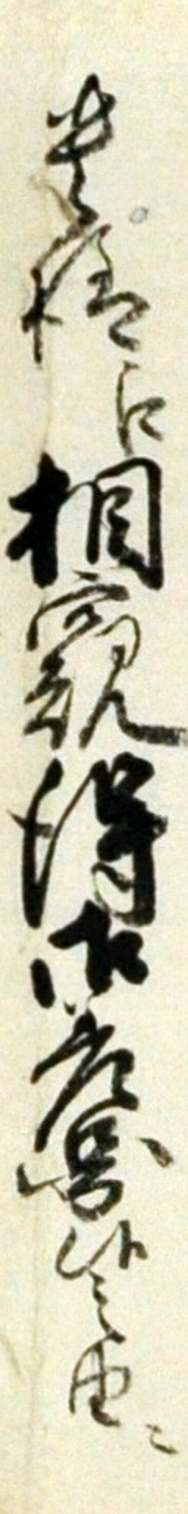貴様江相窺得御差図候之由ニ
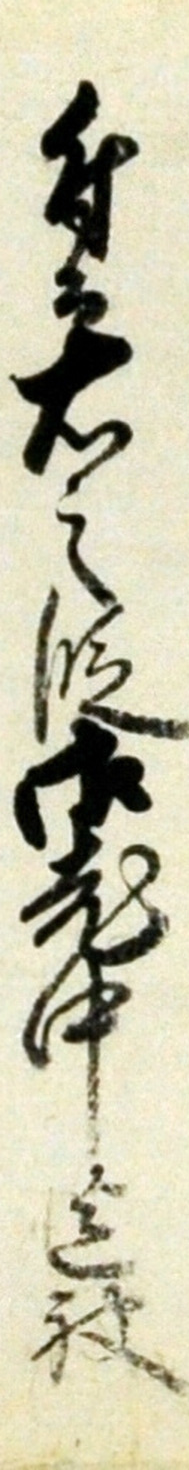付而右之段御老中迄被
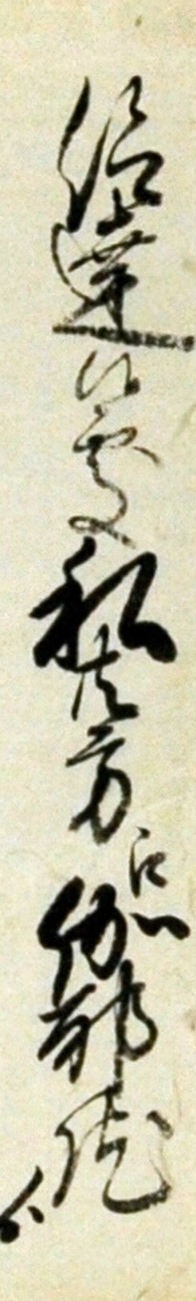仰達候処私共方江伽耶院ゟ
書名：書状
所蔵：伊那市立高遠町図書館・合同会社AMANE
